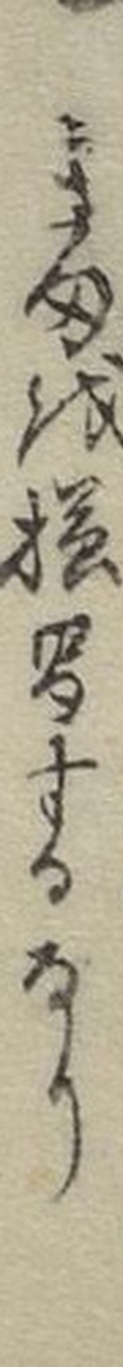さまを模写するなり
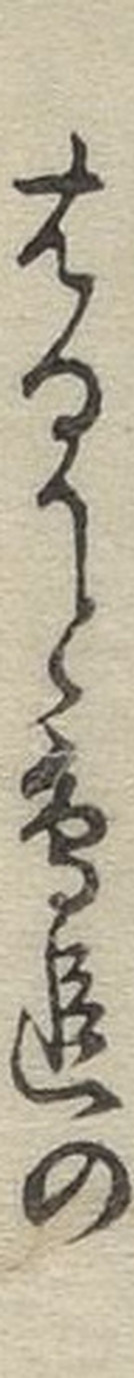はるかと鳥追の
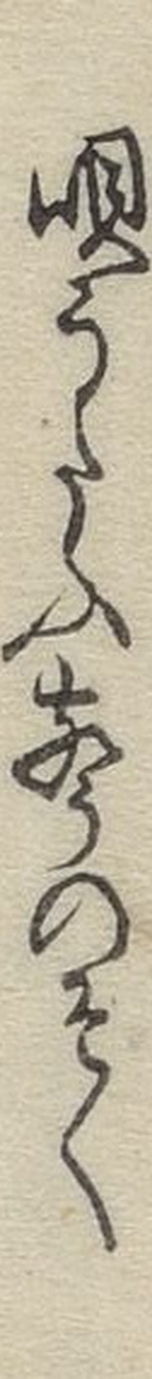唄うたふ声のそく
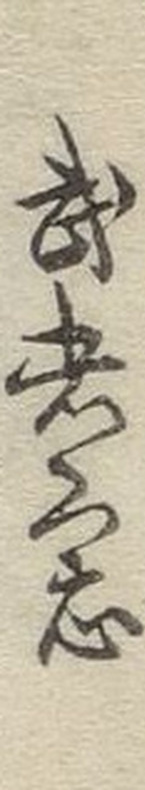武者窓
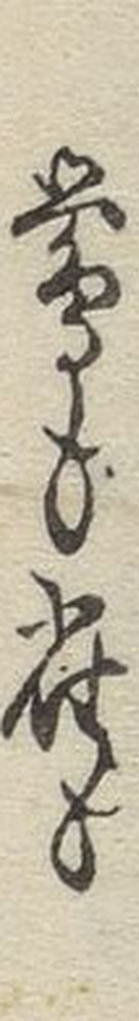鶯も雀も
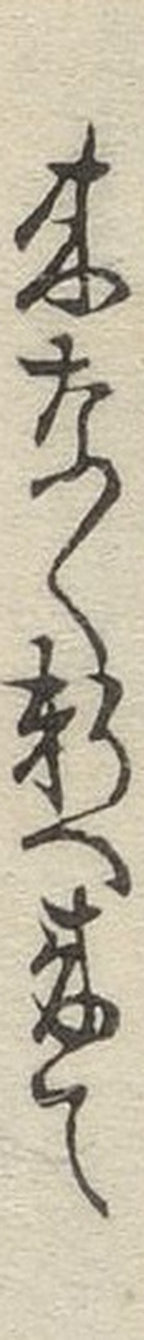来なく軒へ来て
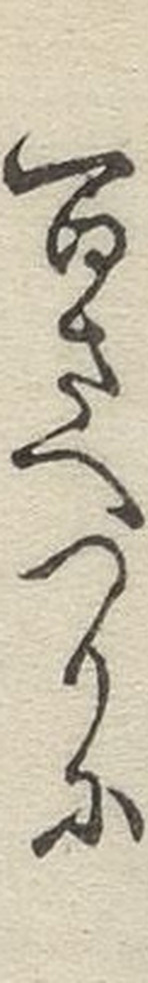百さへつりに
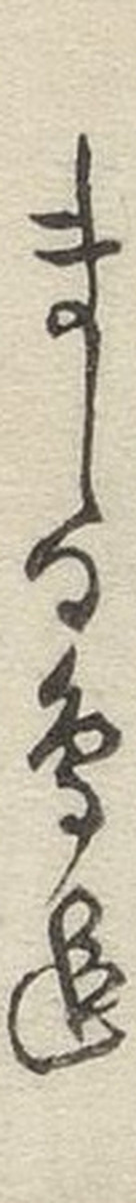ましる鳥追
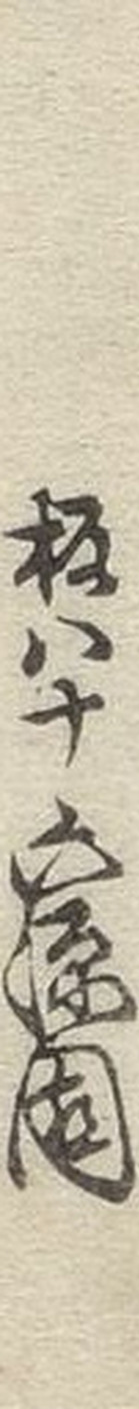板ハナ六源園
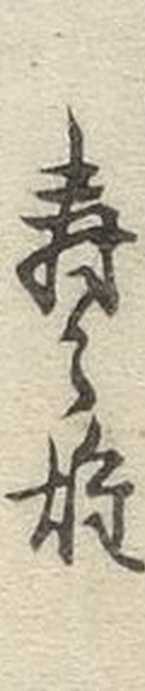寿々雄
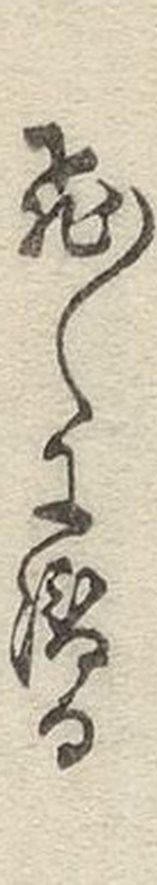飛〳〵に潜る
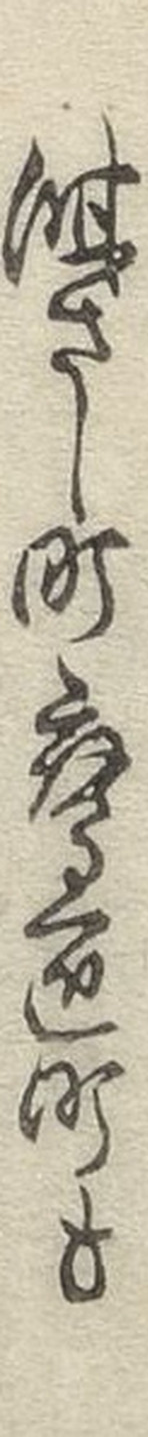餌さし町鷹匠町も
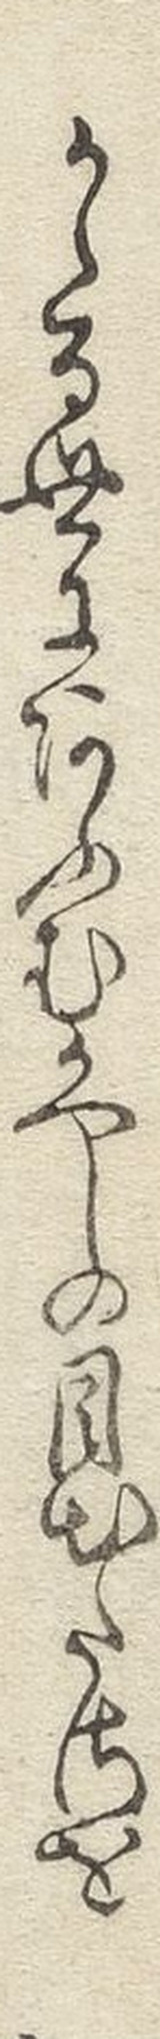かゝる世にあふむかへしの目出たさを
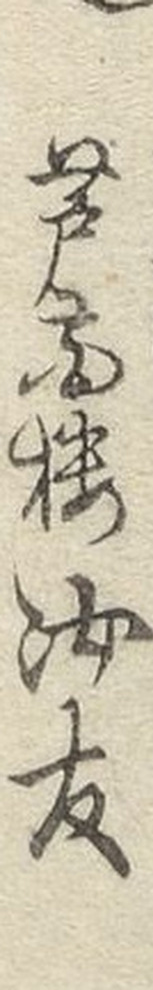芦花楼汝友
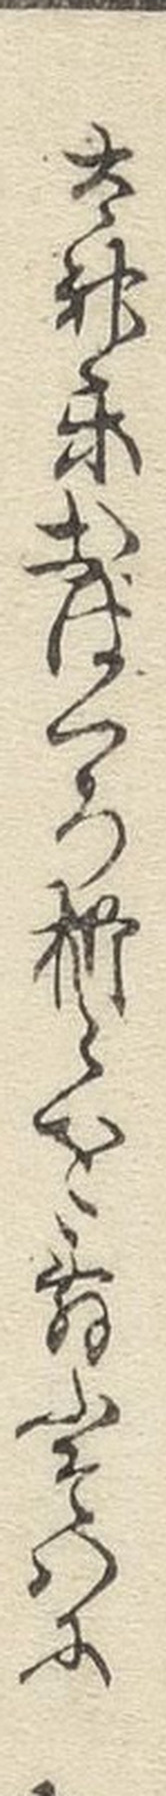太神楽おはくろ獅々を舞ふそはに
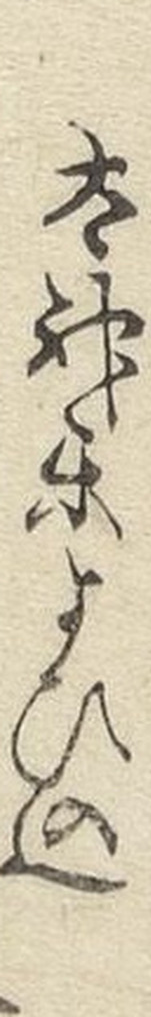太神楽よひ込
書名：Picture Album of People with Kyōka (Light Verse) (Kyōka shiki jinbutsu 狂歌四季人物)
